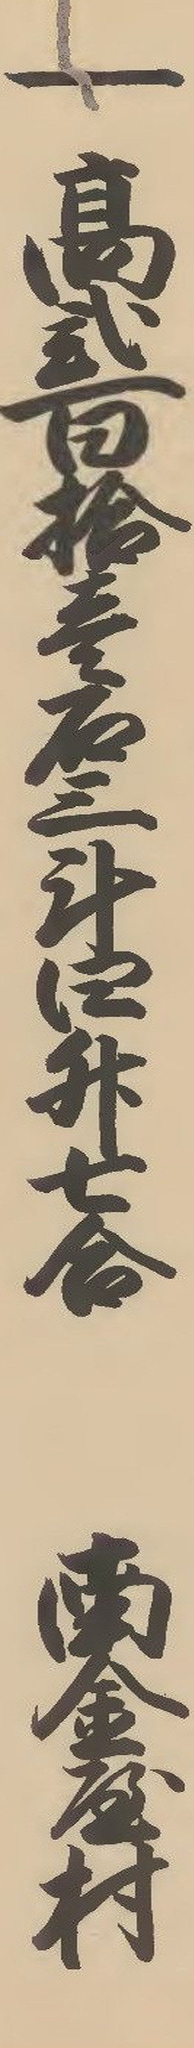一高弐百拾壱石三斗四升七合南金屋村
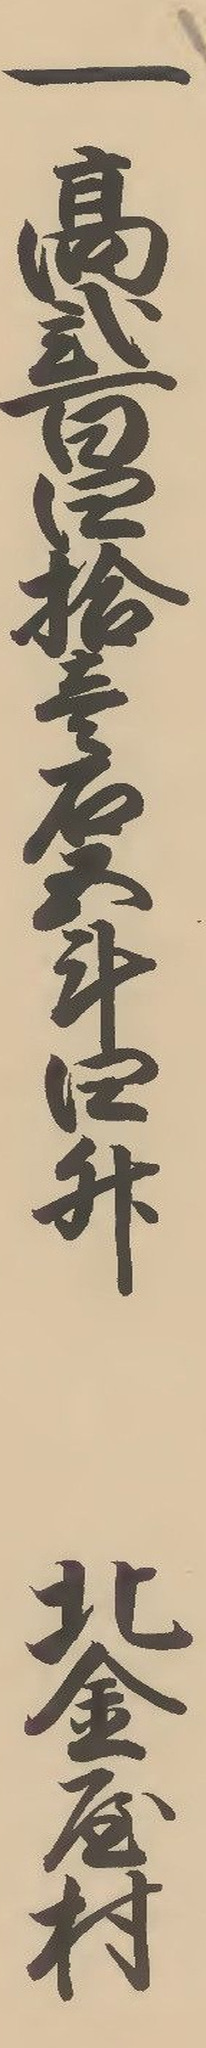一高弐百四拾壱石五斗四升北金屋村

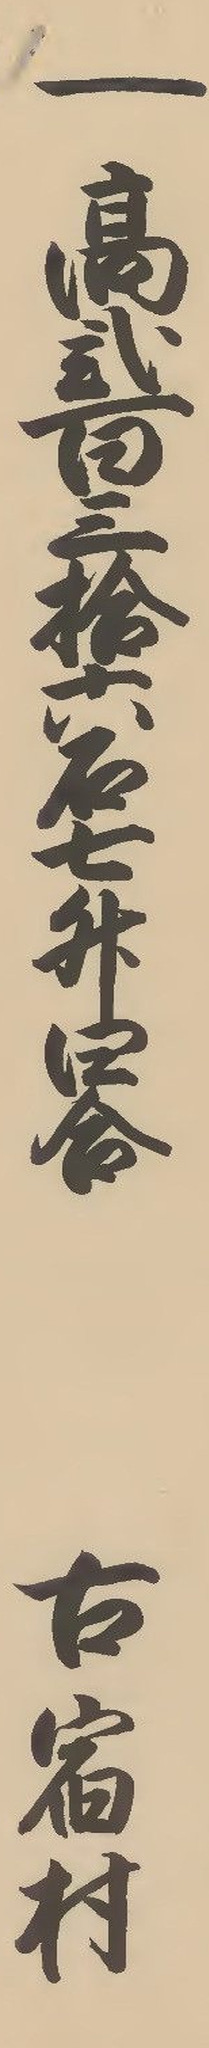一高弐百三拾六石七升四合古宿村
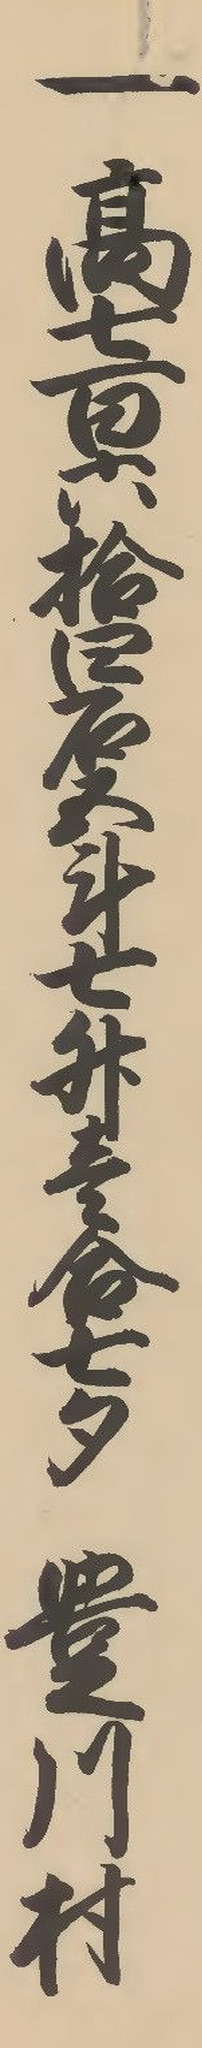一高七百六拾四石五斗七升壱合七勺豊川村
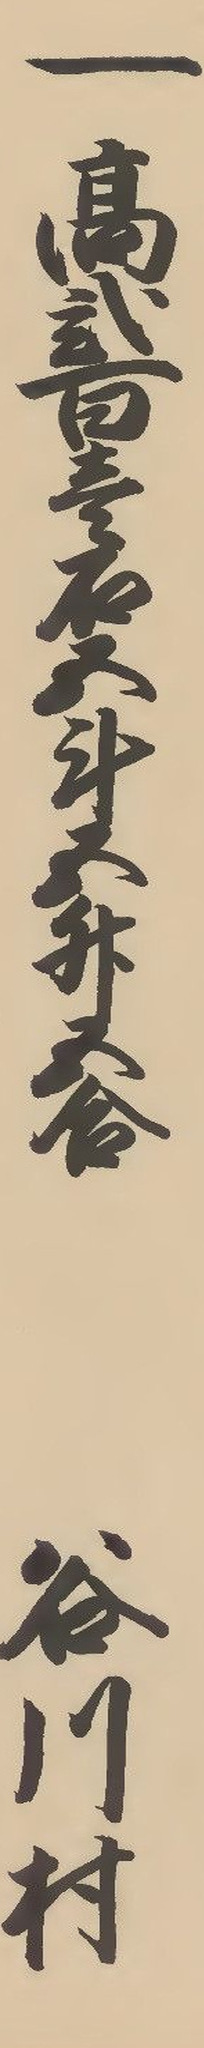一高弐百壱石五斗五升五合谷川村
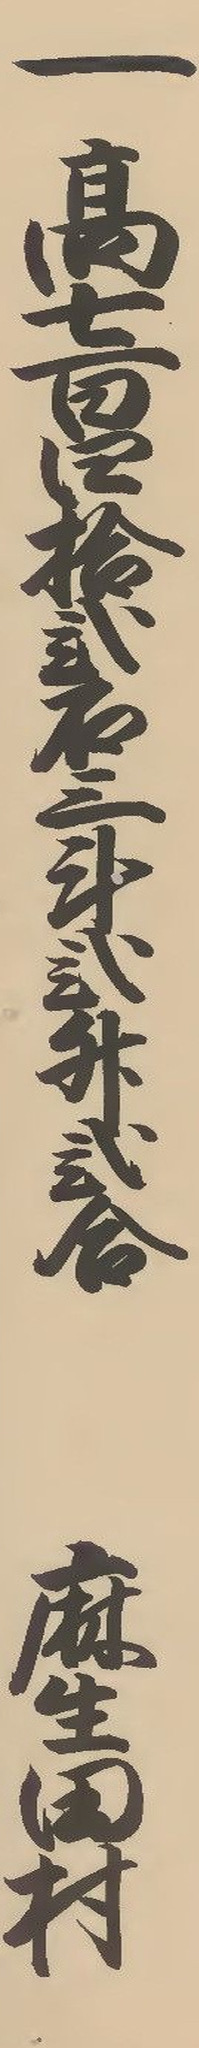一高七百四拾弐石三斗弐升弐合麻生田村
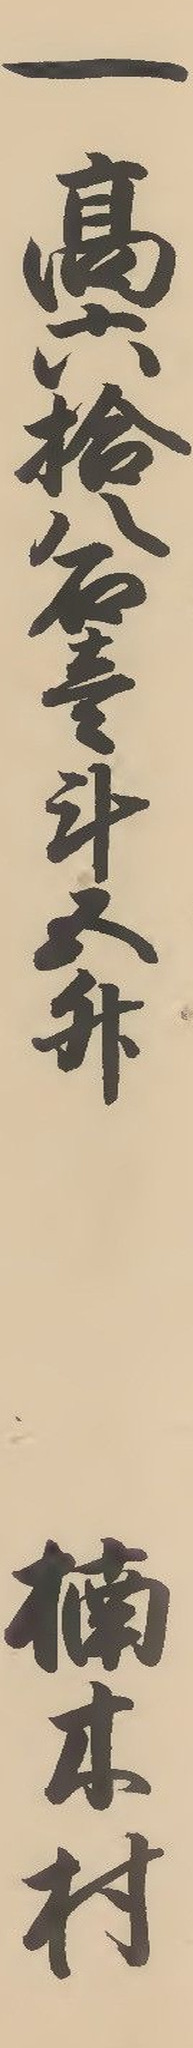一高六拾八石壱斗五升楠木村
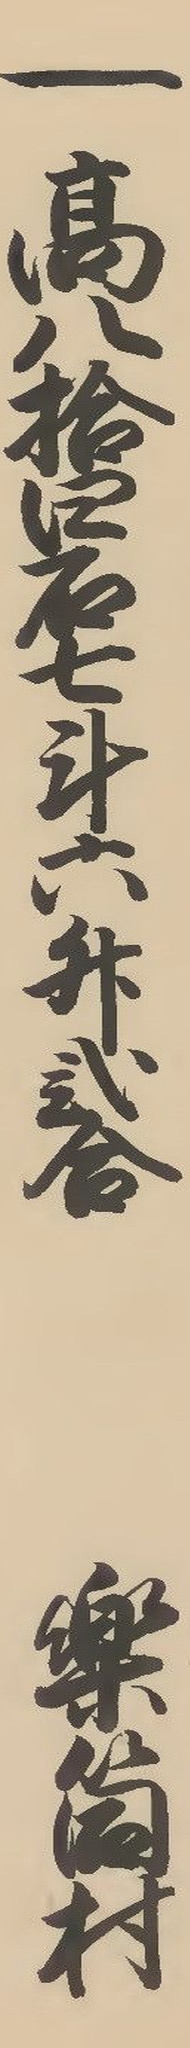一高八拾四石七斗六升弐合楽筒村
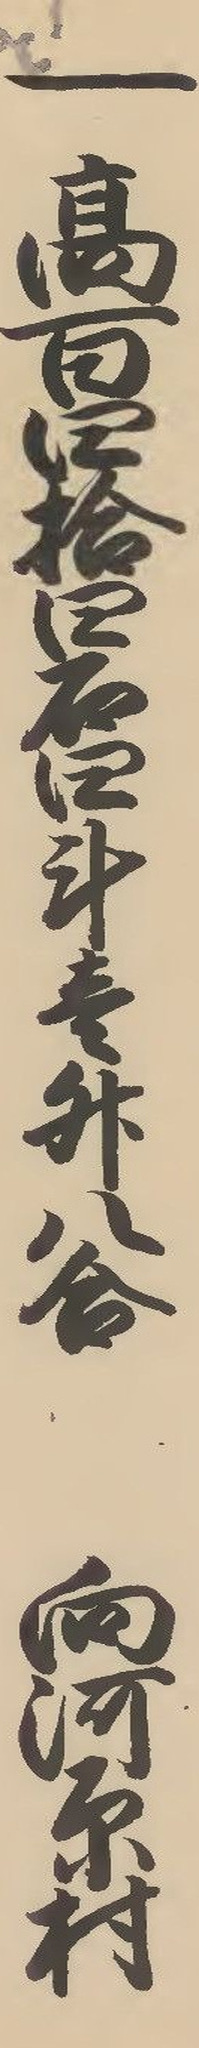一高百四拾四石四斗壱升八合向河原村
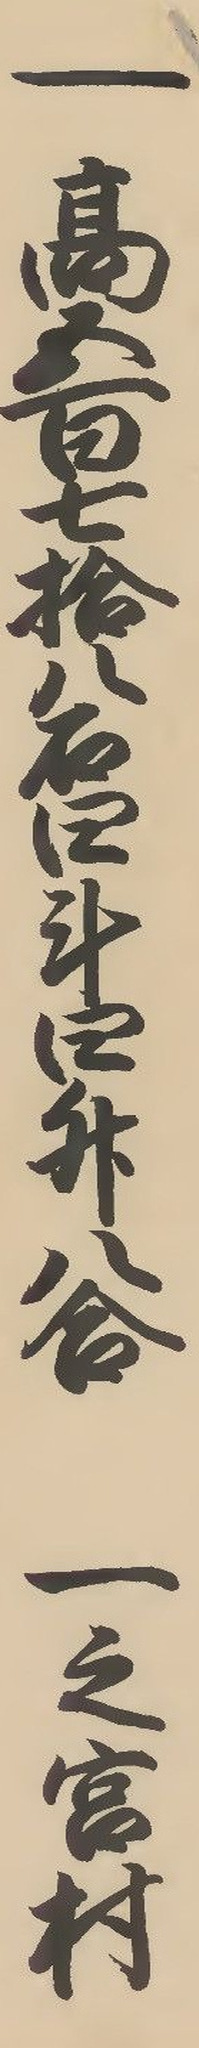一高五百七拾八石四斗四升八合一之宮村

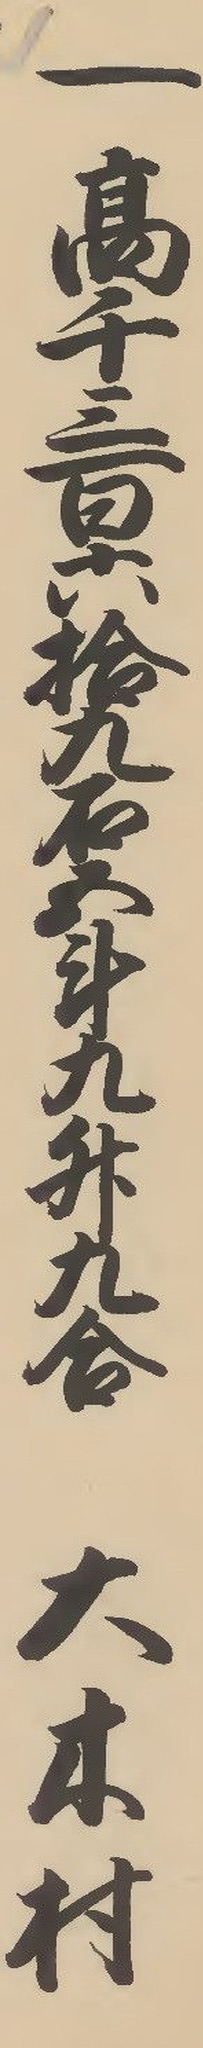一高千三百六拾九石五斗九升九合大木村
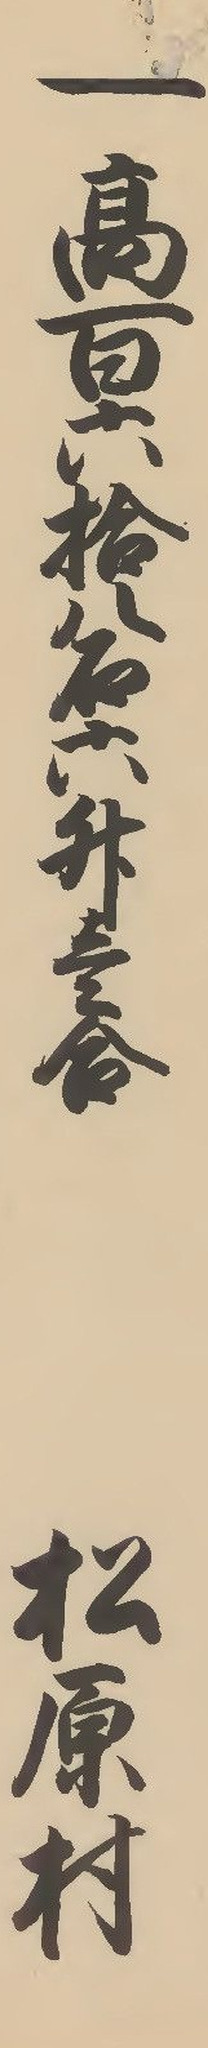一高百六拾八石六升壱合松原村
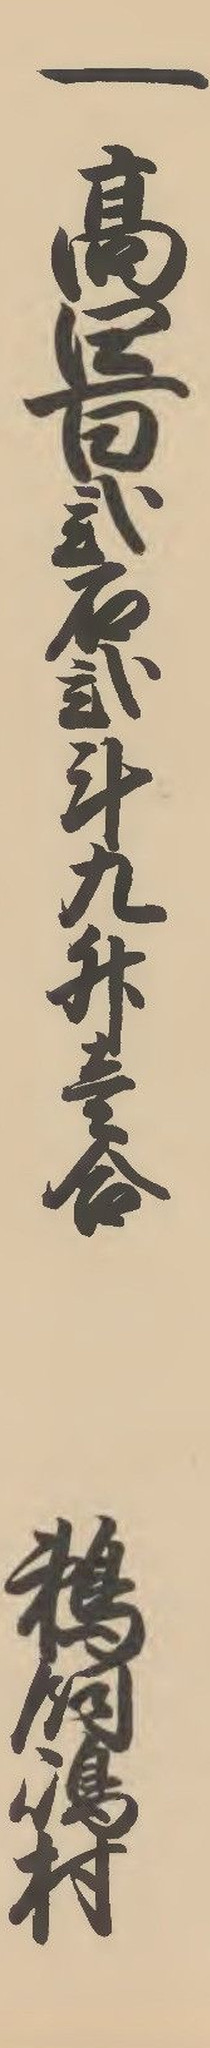一高四百弐石弐斗九升壱合鵜飼島村
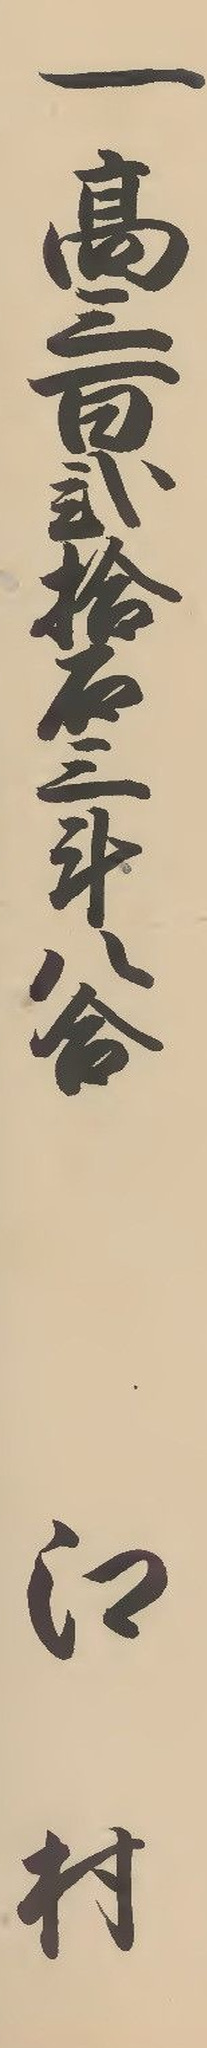一高三百弐拾石三斗八合江村
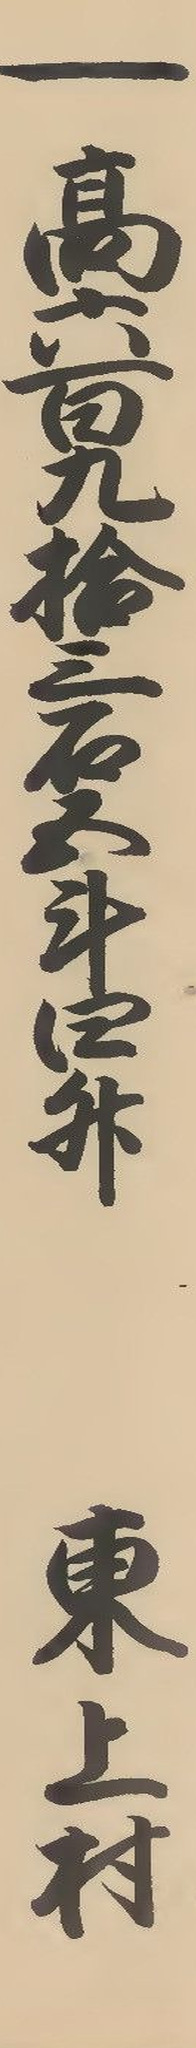一高六百九拾三石五斗四升東上村
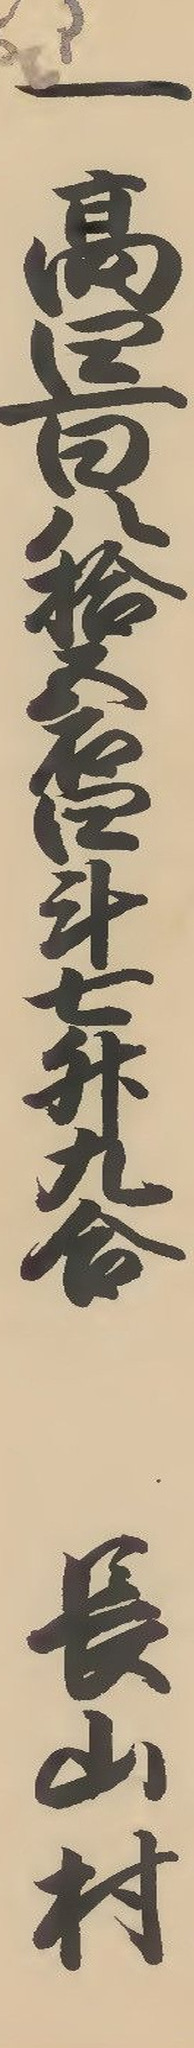一高四百八拾五石四斗七升九合長山村
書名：三河国郷帳
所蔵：国立公文書館 National Archives of Japan
